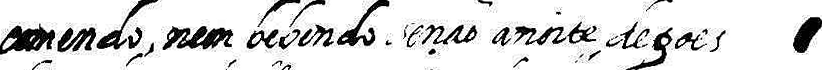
comendo, nem bebendo senão a noite, depoes
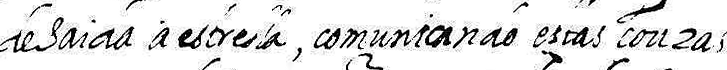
de saida a estrella, comunicando estas couzas
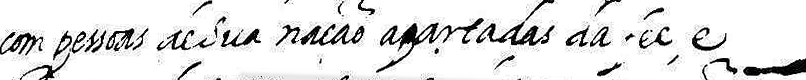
com pessoas de sua nação apartadas da fee, e
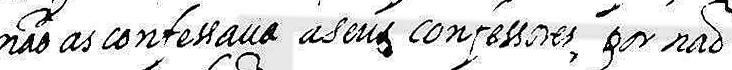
não as confessaua a seus confessores, por naõ
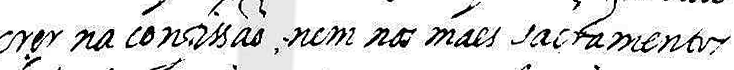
crer na confissão, nem nos maes sacramentos
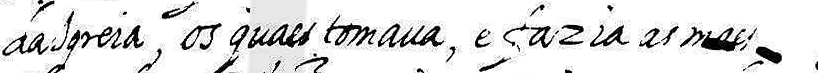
da Igreia, os quaes tomaua, e fazia as maes
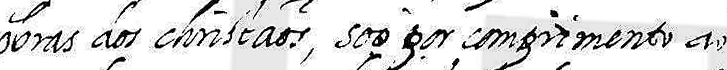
obras dos christaõs, soo por comprimento do
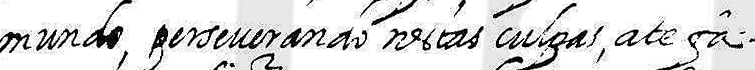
mundo, perseuerando nestas culpas, ate fa
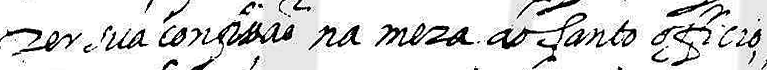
zer sua confissaõ na meza do Santo officio;
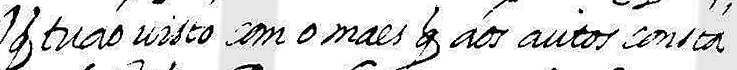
O q̄ tudo visto com o maes q̄ dos autos consta
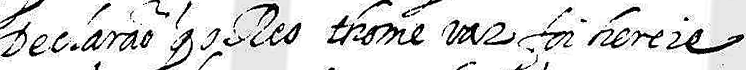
Declaraõ q̄ o Reo thomé vaz foi hereie
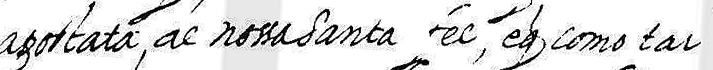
apostata, de nossa Santa fee e q̄ como tal
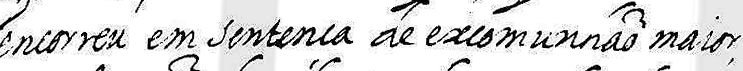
encorreu em sentença de excomunhaõ maior,
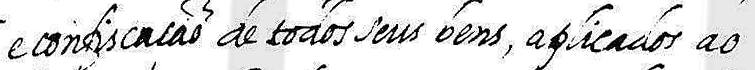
e confiscaçaõ de todos seus bens, aplicados ao
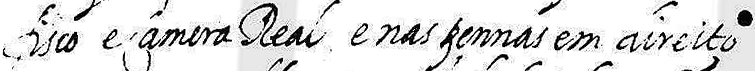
fisco e Camera Real e nas pennas em direito
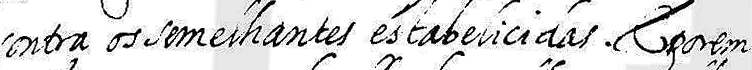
contra os semelhantes estabelicidas. E porem
